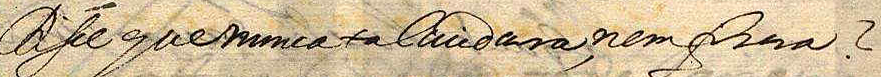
Disse que nunca tal cuidara, nem fizera?
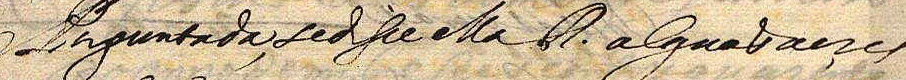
Perguntada, se disse ella R. alguas̄ uezes
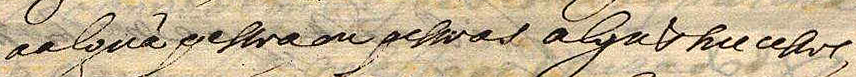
a alguā pessoa ou pessoas algus̄ sucessos
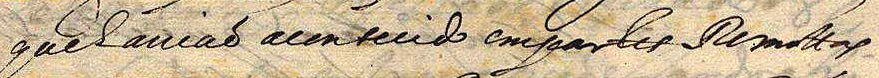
que hauiaõ acontecido em partes Remottas
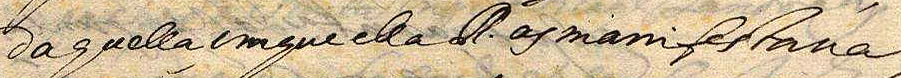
daquella em que ella R. as manifestaua
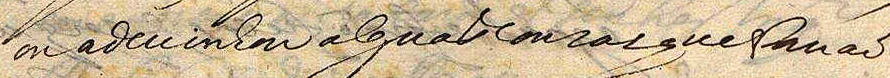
ou adeuinhou alguas̄ couzas que estauaõ
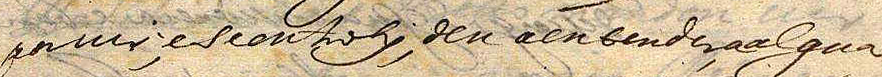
por uir, e se outrosy, deu a entender, a algua
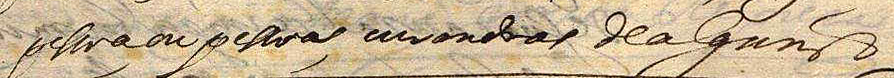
pessoa, ou pessoas, curandoas de alguns
